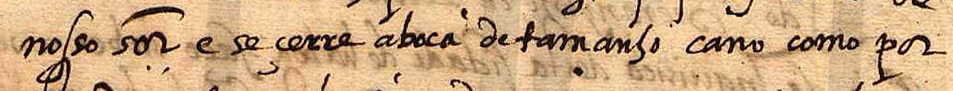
nosso s̄or e se cerre a boca de tamanho cano como por
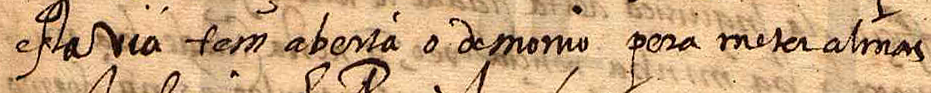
esta via tem aberta o demonio pera meter almas
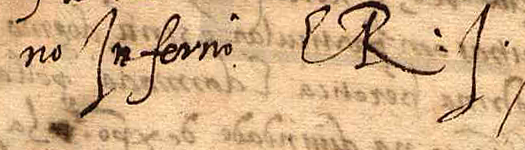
no Jnferno E R. J.
